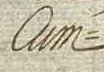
Cum
